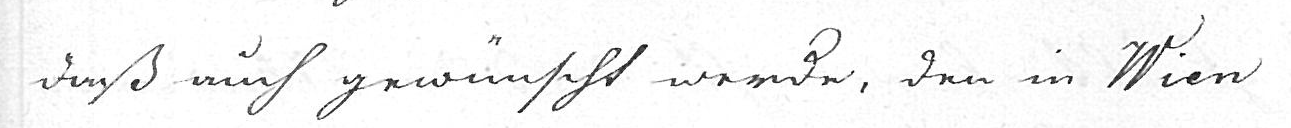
daß auch gewünscht werde, den in Wien
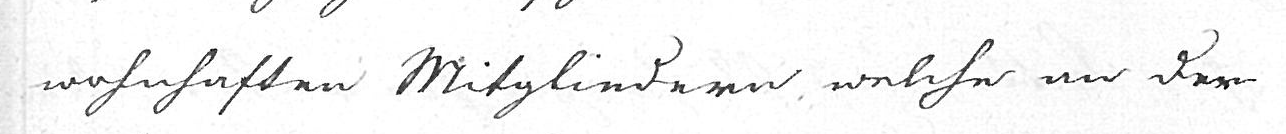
wohnhaften Mitgliedern, welche an der
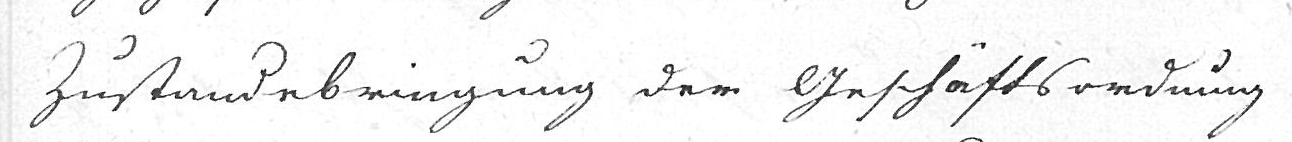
Zustandebringung der Geschäftsordnung
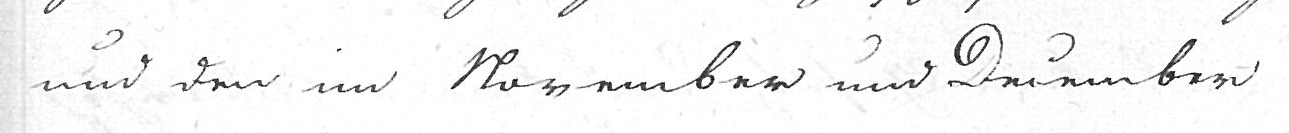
und der im November und December
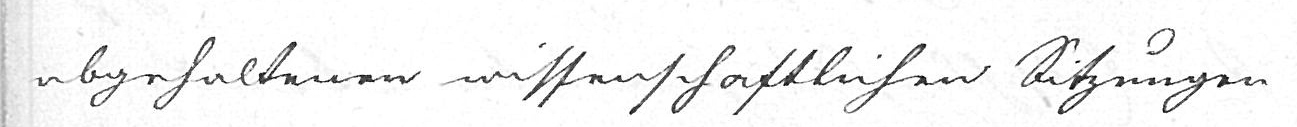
abgehaltenen wissenschaftlichen Sitzungen
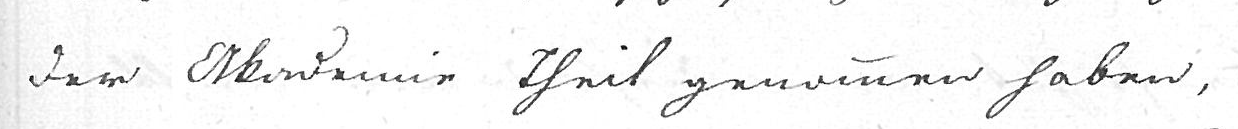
der Akademie Theil genommen haben,
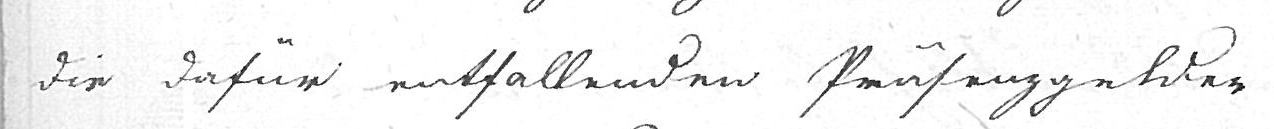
die dafür entfallenden Präsenzgelder
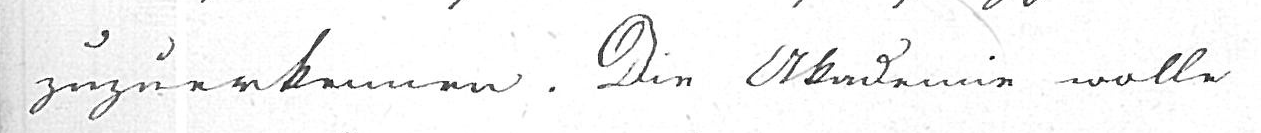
zuzuerkennen. Die Akademie wolle
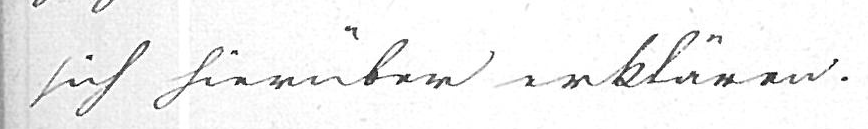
sich hierüber erklären.
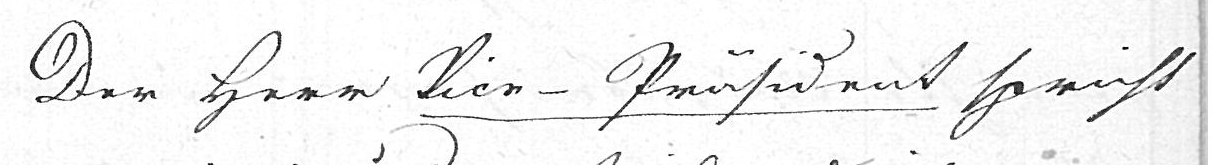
Der Herr Vice-Präsident spricht
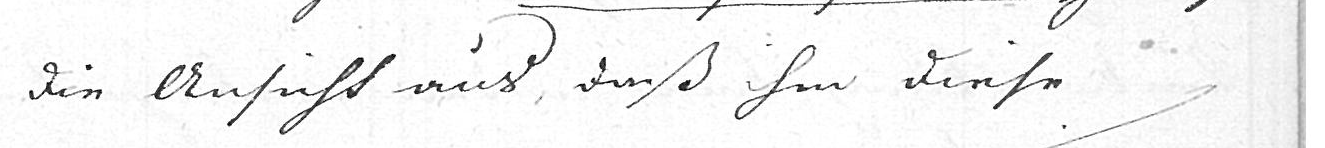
die Ansicht aus, daß ihm diese
